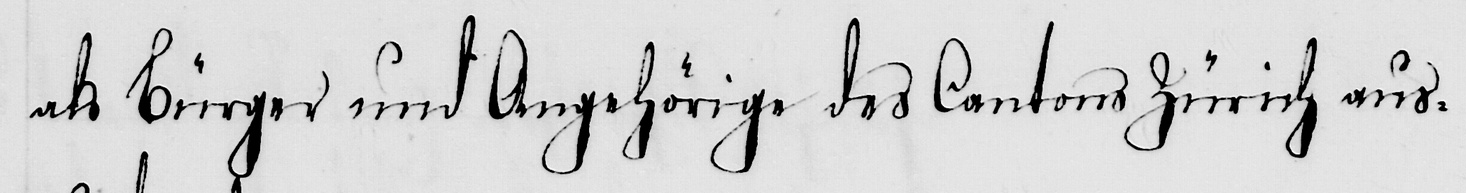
als Bürger und Angehörige des Cantons Zürich aus¬
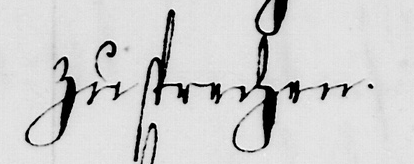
zusprechen.
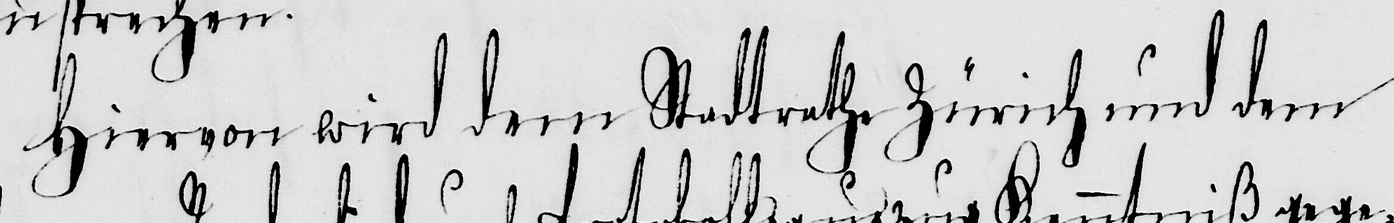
Hiervon wird dem Stadtrathe Zürich und dem
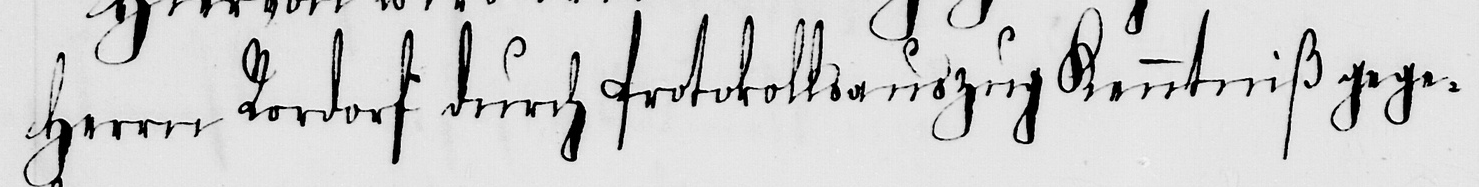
Herrn Rordorf durch Protokollsauszug Kenntniß gege¬
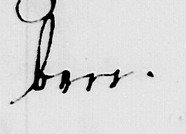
ben.
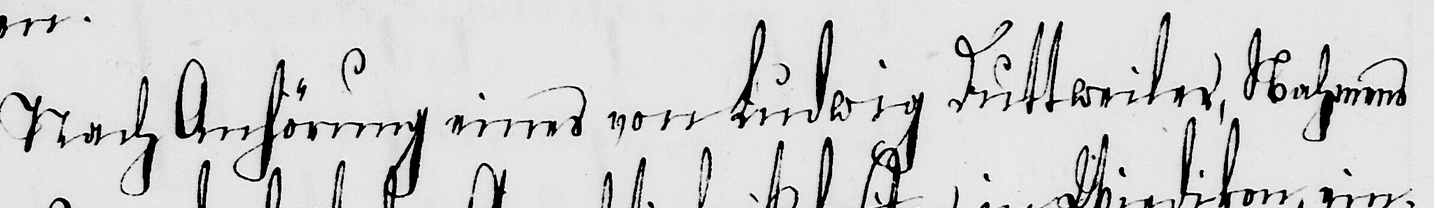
Nach Anhörung eines von Ludwig Duttweiler, Nahmens
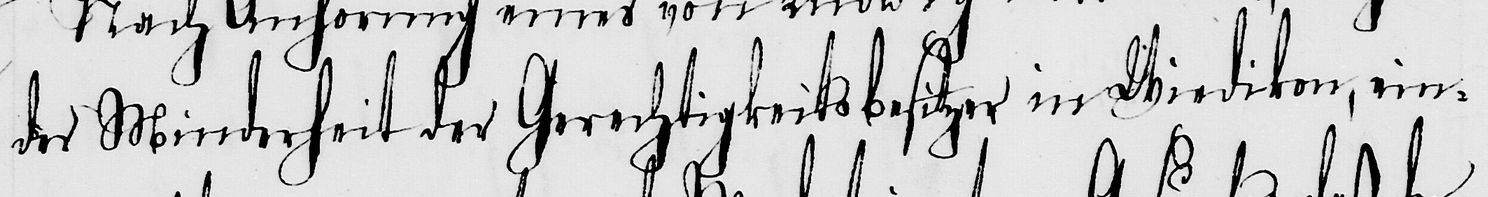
der Minderheit der Gerechtigkeitsbesitzer in Wiedikon, ein¬
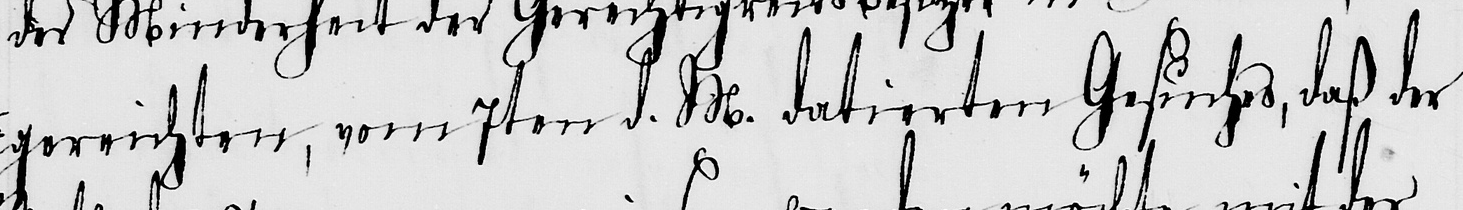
gereichten, vom 7ten d. M. datirten Gesuches, daß der
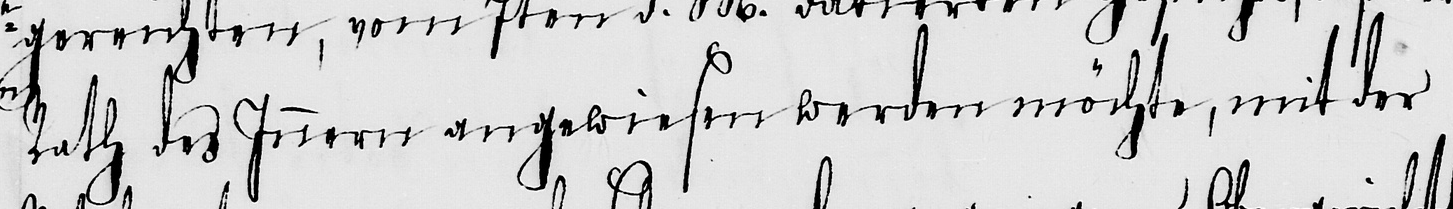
Rath des Innern angewiesen werden möchte, mit der
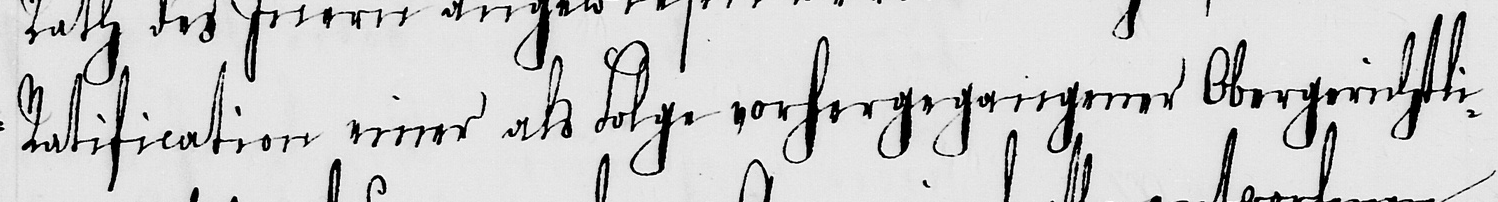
Ratification einer als Folge vorhergegangener Obergerichtli¬
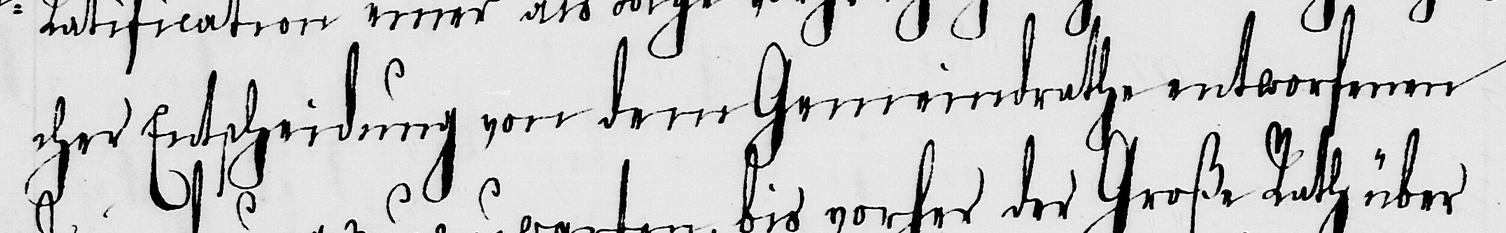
cher Entscheidung von dem Gemeindrathe entworfenen
